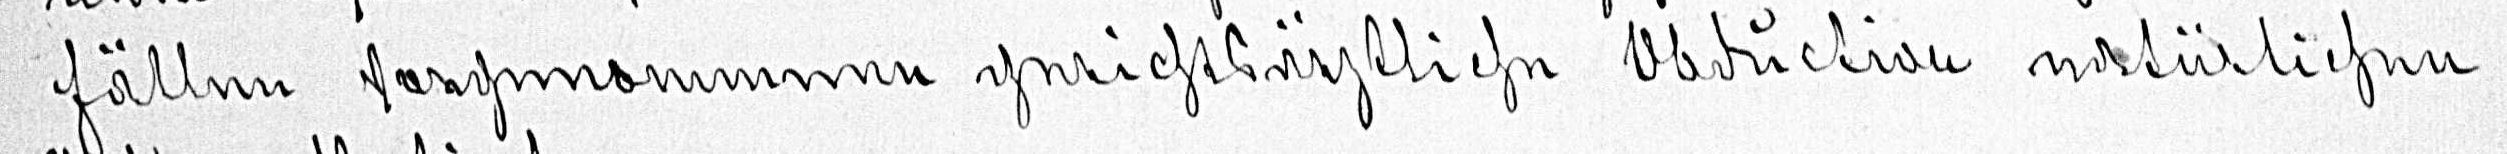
Fällen vorgenommene gerichtsärztliche Obduction natürlichen
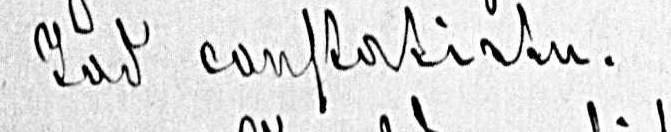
Tod constatirte.
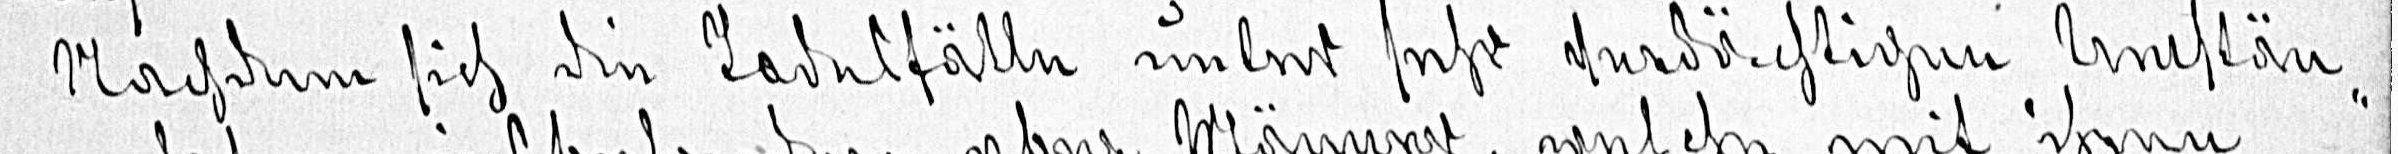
Nachdem sich die Todesfälle unter sehr verdächtigen Umstän¬
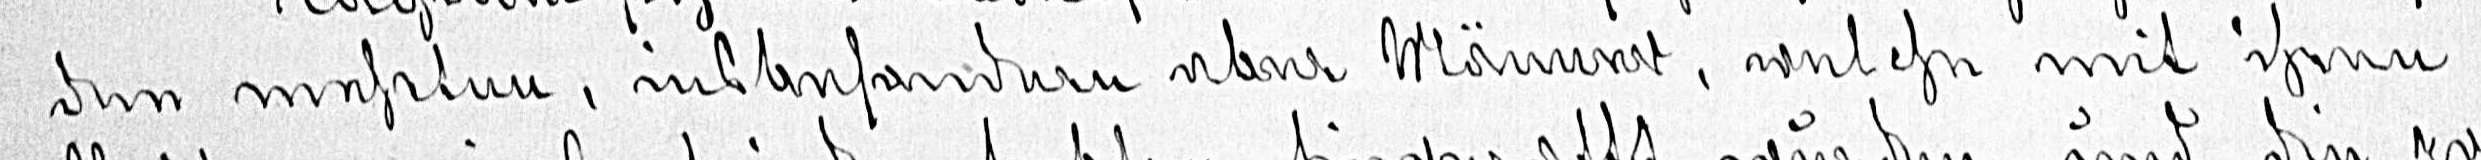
den mehrten, insbesondere aber Männer, welche mit ihren
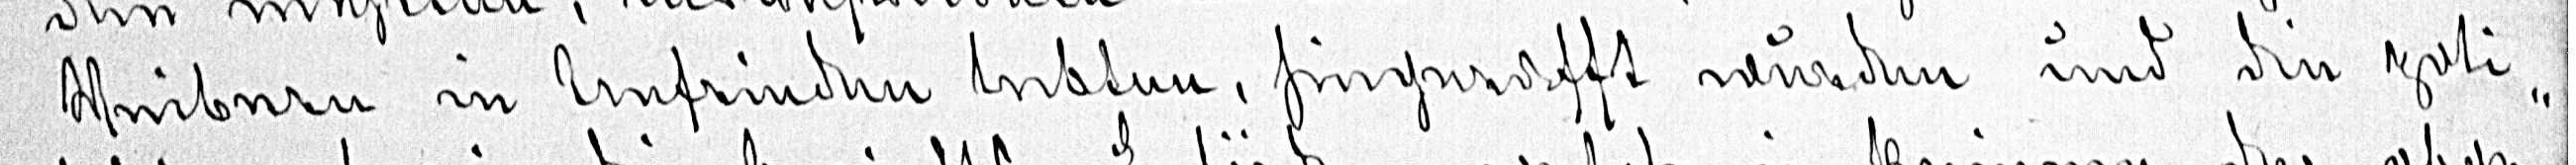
Weibern in Unfrieden lebten, hingerafft wurden und die poli¬
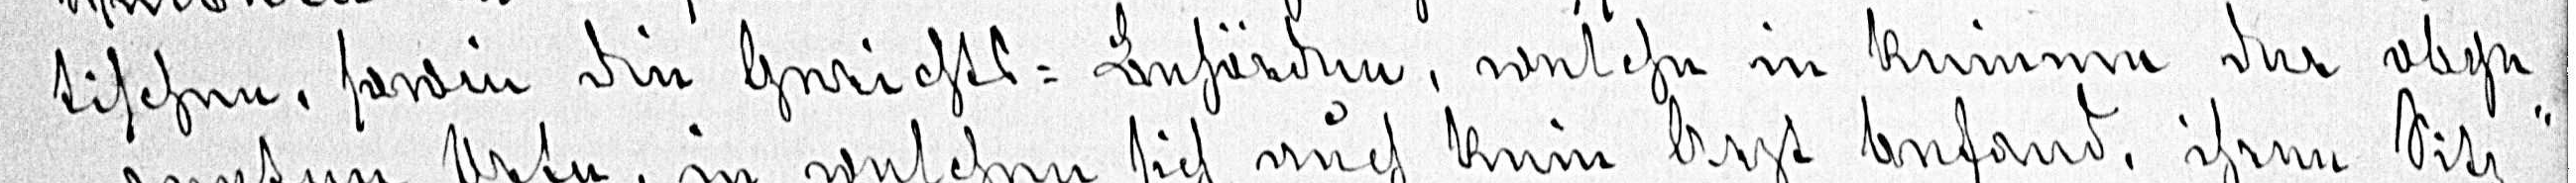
ischen, sowie die Gerichts-Behörden, welche in keinem der obge¬
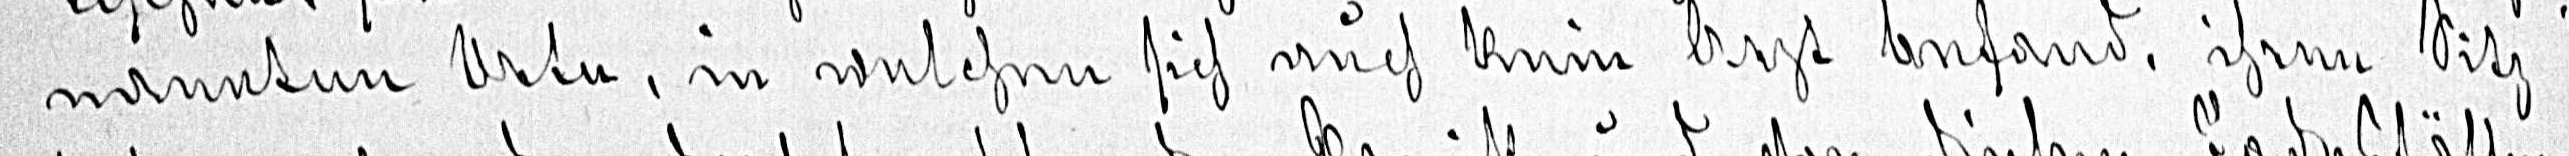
nannten Orte, in welchen sich auch kein Arzt befand, ihren Sitz
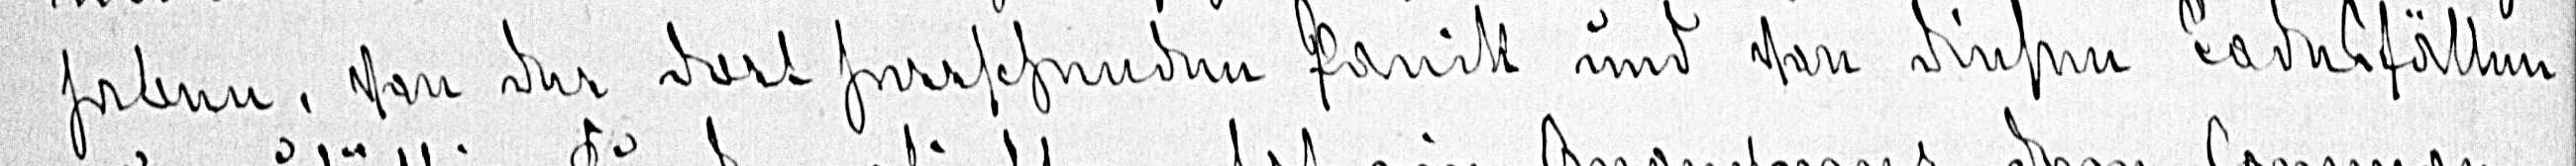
haben, von der dort herrschenden Panik und von diesen Todesfällen
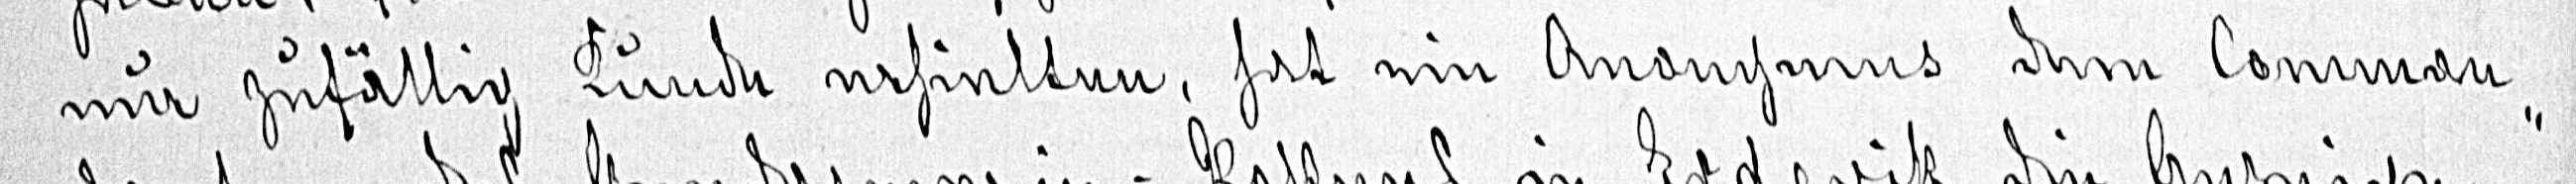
nur zufällig Kunde erhielten, hat ein Anonymus dem Comman¬
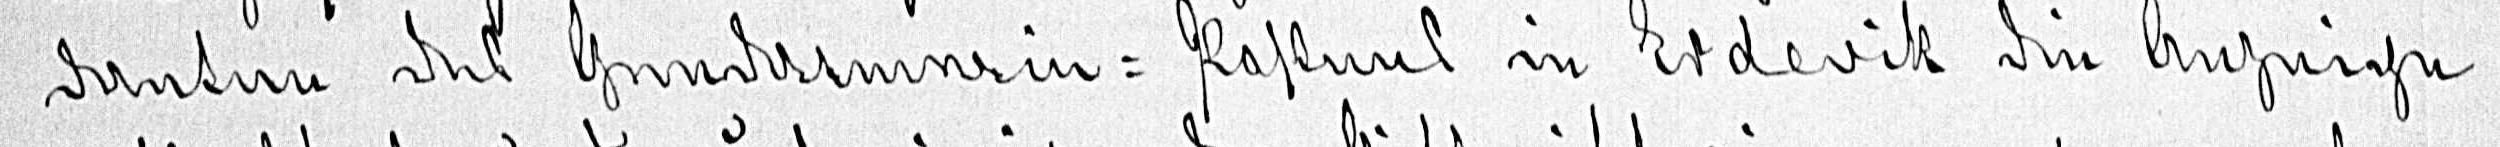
danten des Gendarmerie-Postens in Erdevik die Anzeige
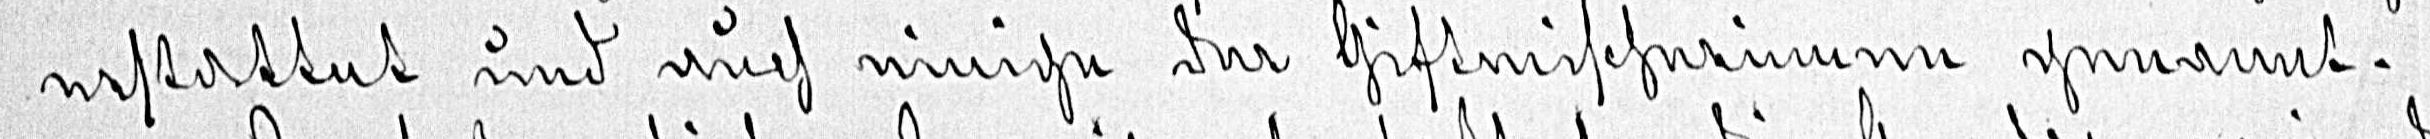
erstattet und auch einige der Giftmischerinnen genannt.
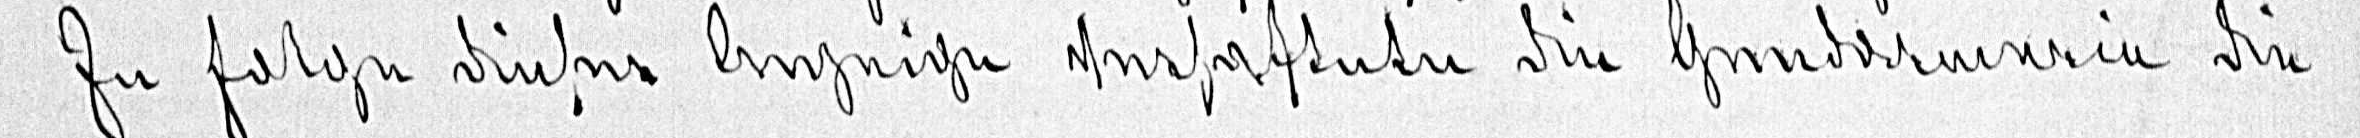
In Folge dieser Anzeige verhaftete die Gendarmerie die
